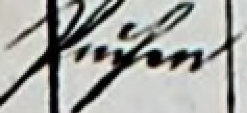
Pusen
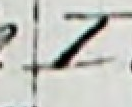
I
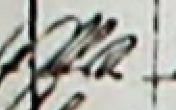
Pfs.
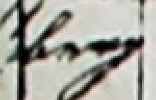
berg
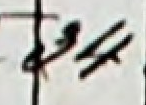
34
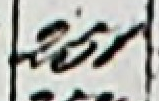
251
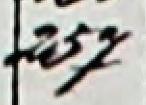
257
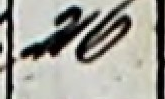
216
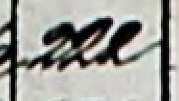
222
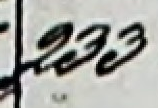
233
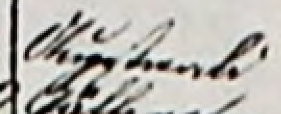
Augstwald
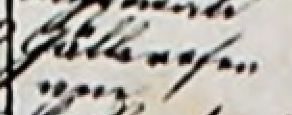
Gällerosen
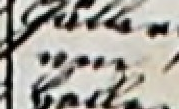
nen
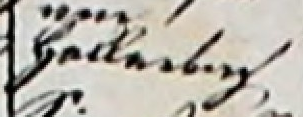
Hollenberg
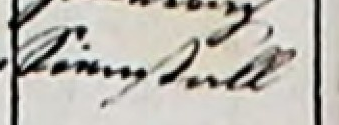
Sienstall
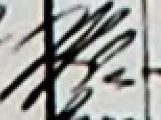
Pfs„
